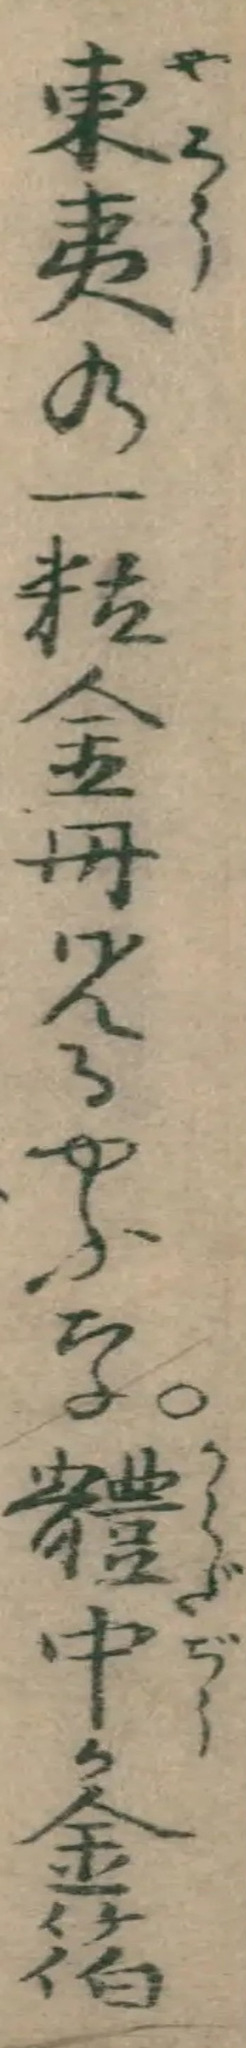東夷の一粒金丹見るやふな。体中か金箔
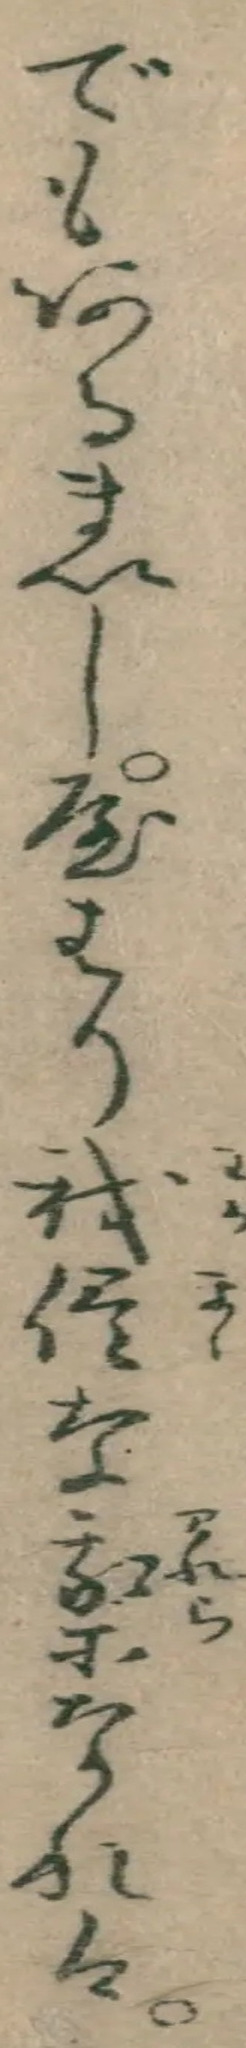でもあるまいし。やはり我侭な我等なれは。
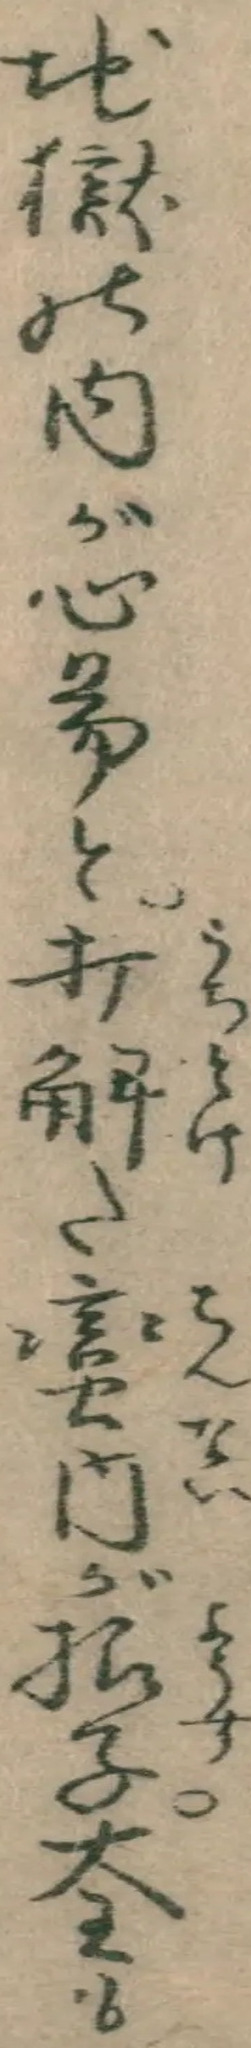地獄の内が心易と。打解た蛮内が様子。大王も
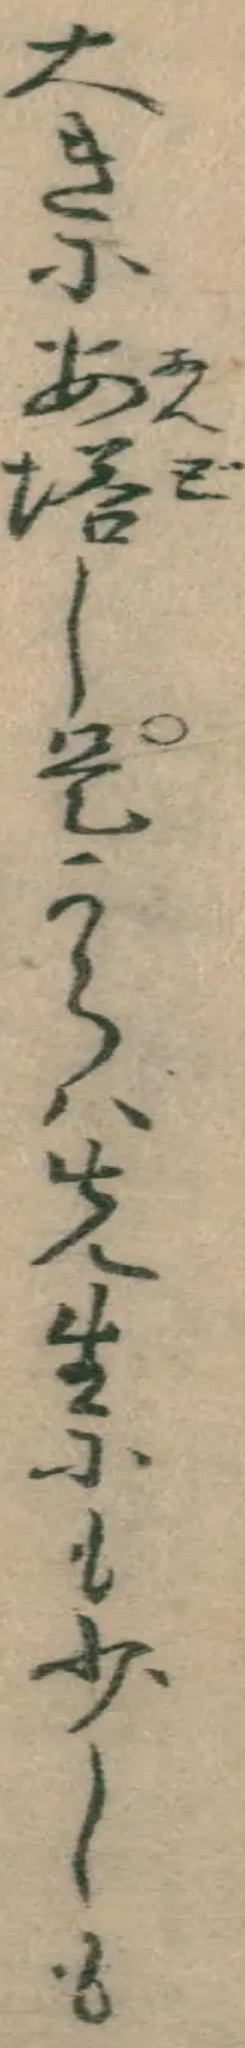大きに安堵し。是からは先生にも少しも
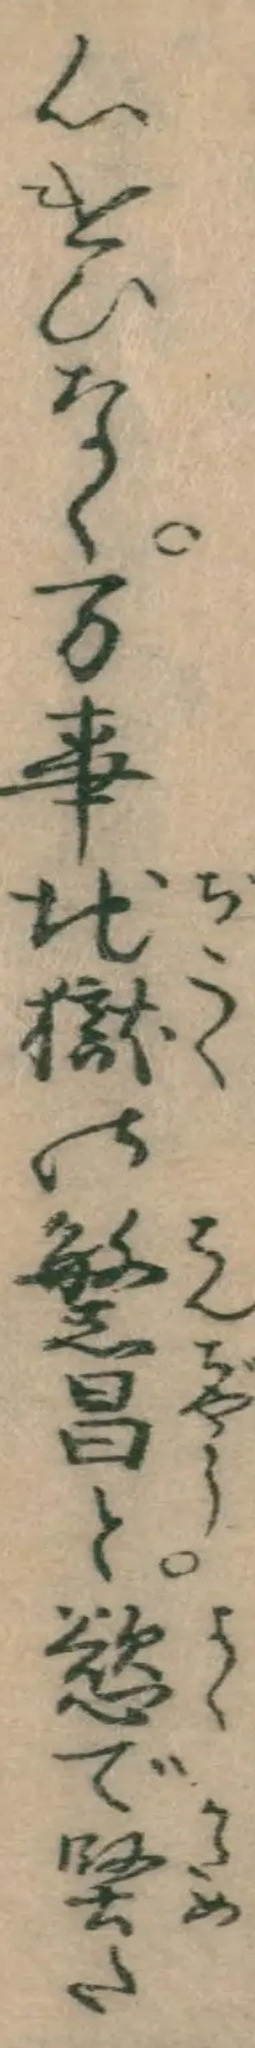心遣ひなく。万事地獄の繁昌と。欲で堅た
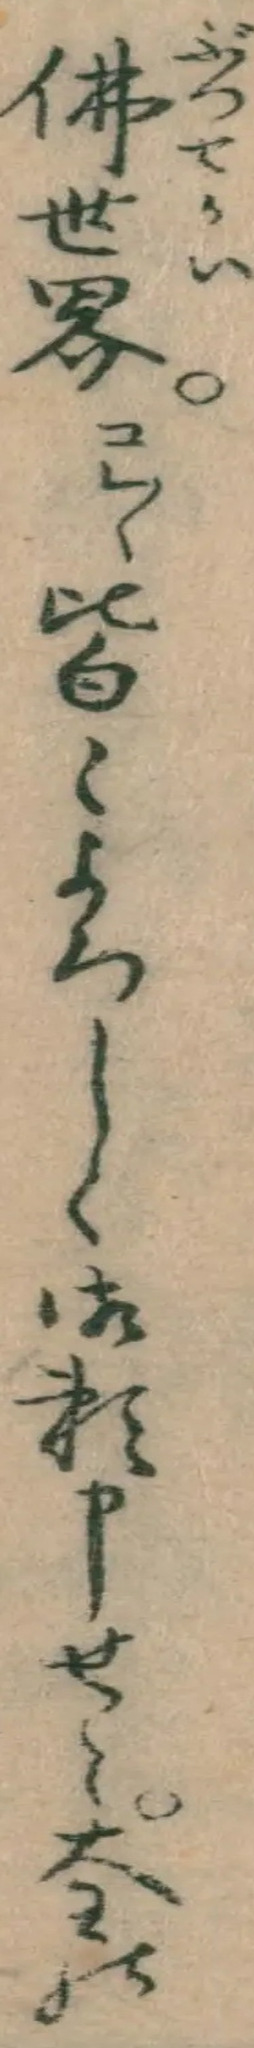仏世界。コレ〳〵皆々よろしく御頼申せと。大王の
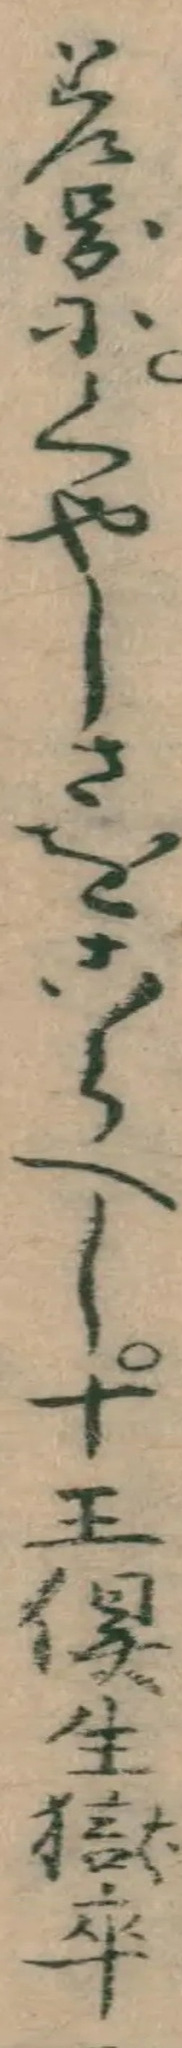差図に。くやしさをこらへし。十王俱生獄卒
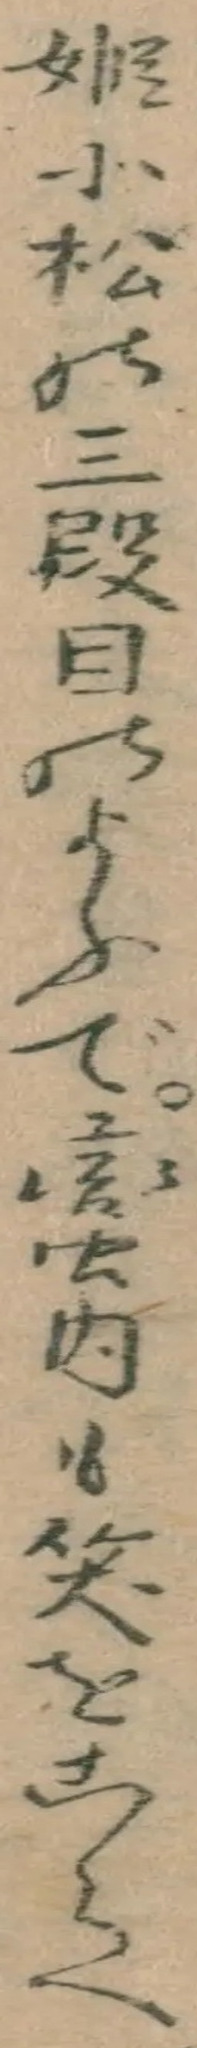姫小松の三段目のよふで。蛮内も笑をこらへ。
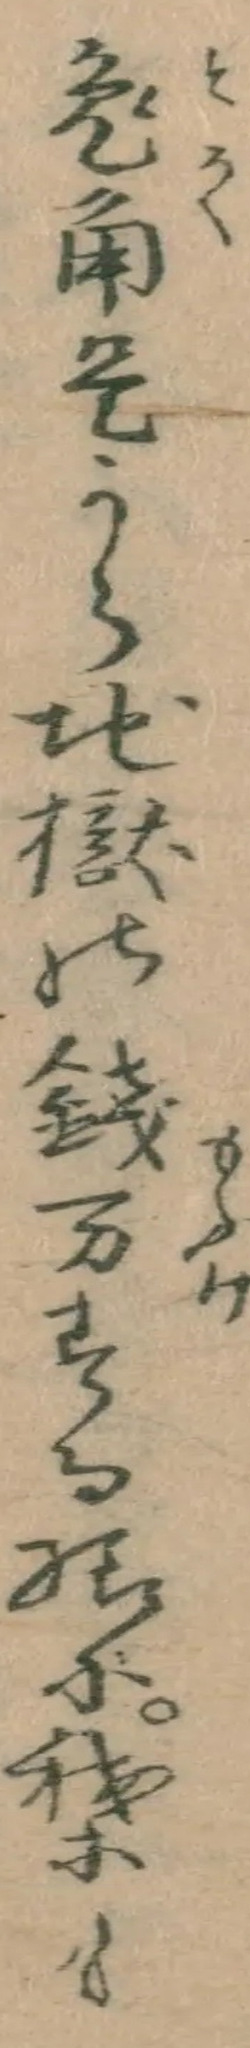兎角是から地獄の銭万する様に。我等も
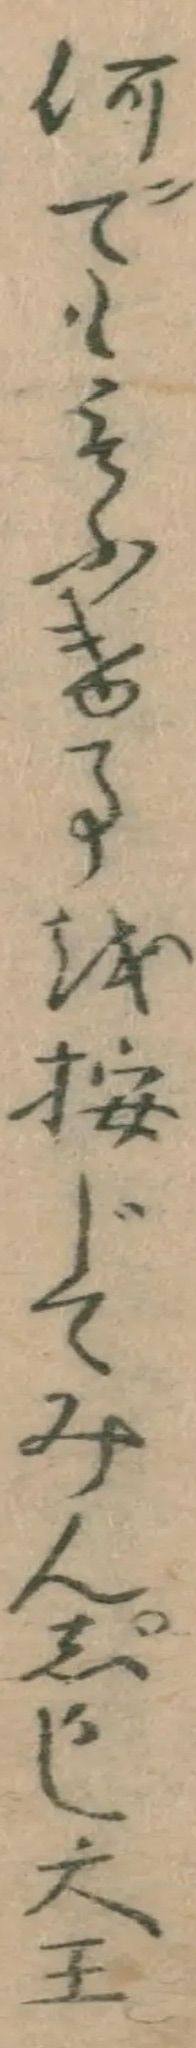何でももふけ事を按じてみん。しかし大王
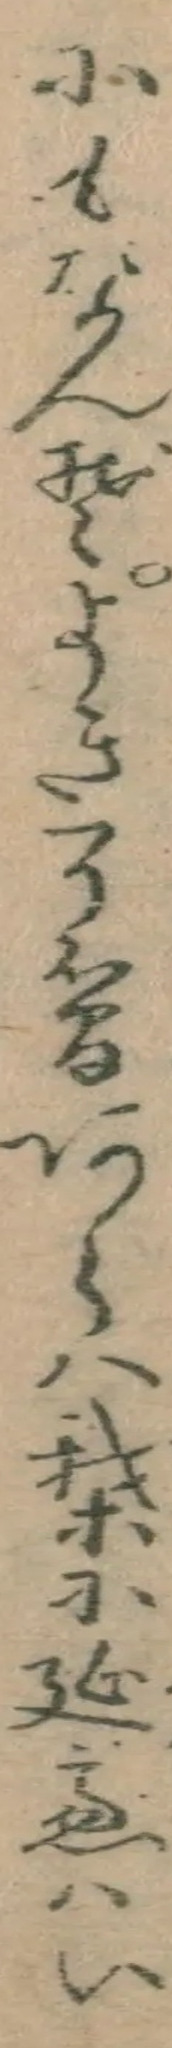にもなんぞ。よき了簡あらは我等に延慮はい
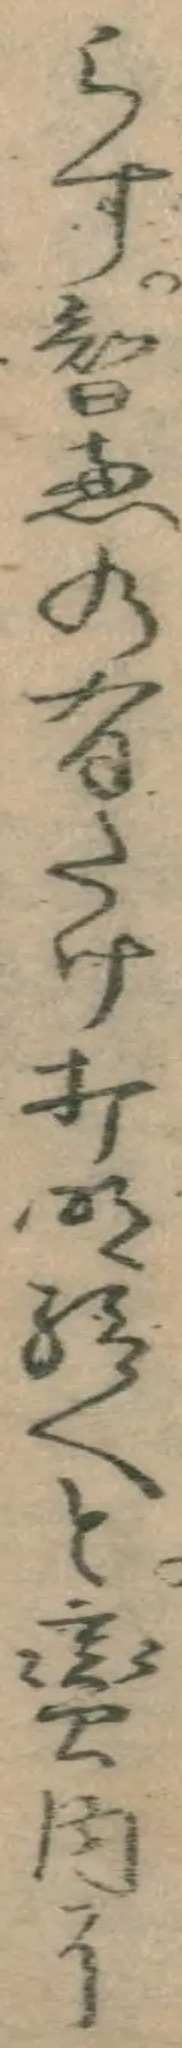らず。知恵の有たけ打明給へと。蛮内に
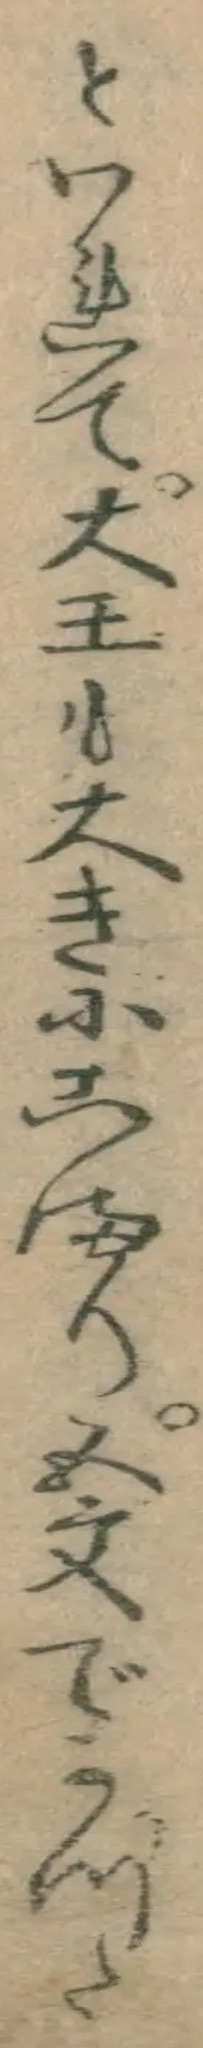とわれて。大王も大きにこまり。五文でかつた
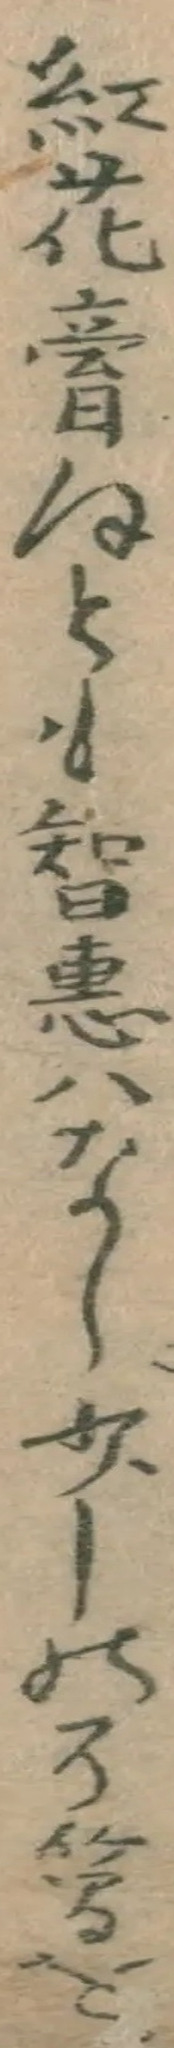紅花膏何とも知恵はなし。少しの了簡を
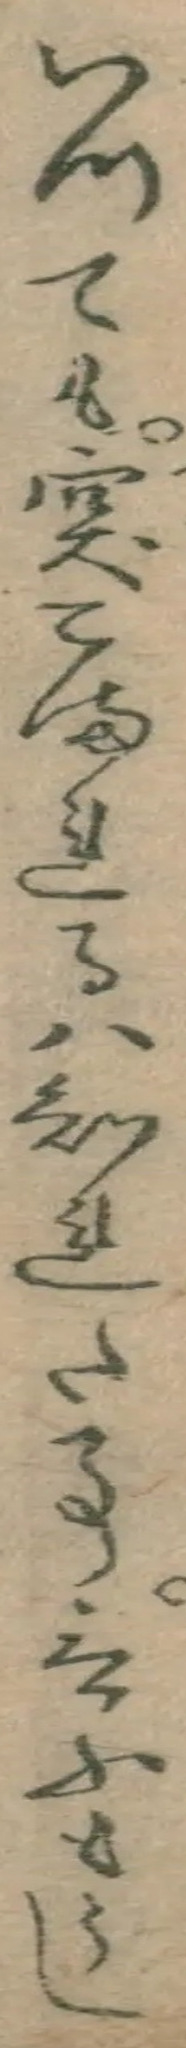いつても。突こまれるは知れた事。言ふもうし

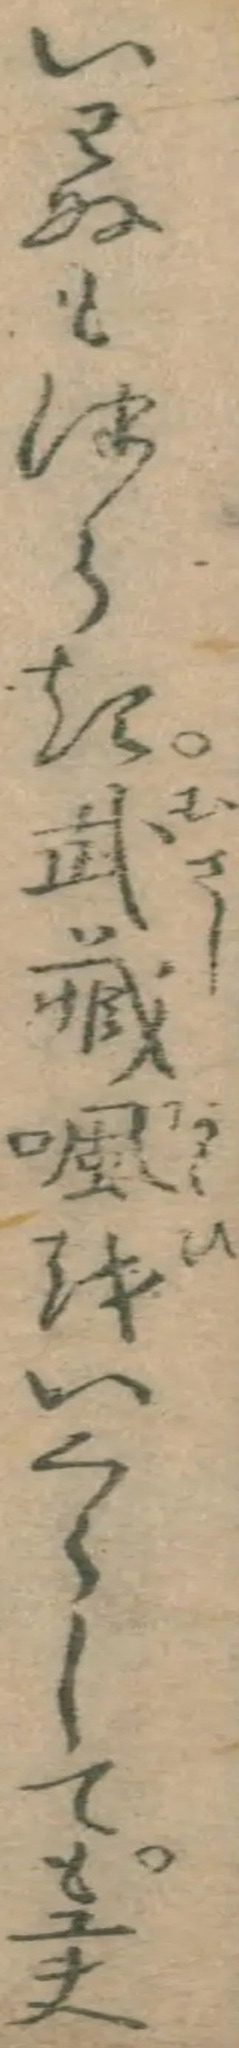いわぬもつらき。武蔵𠷕をいくらしても。工夫
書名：翻草盲目
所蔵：国立国会図書館 National Diet Library, JAPAN
